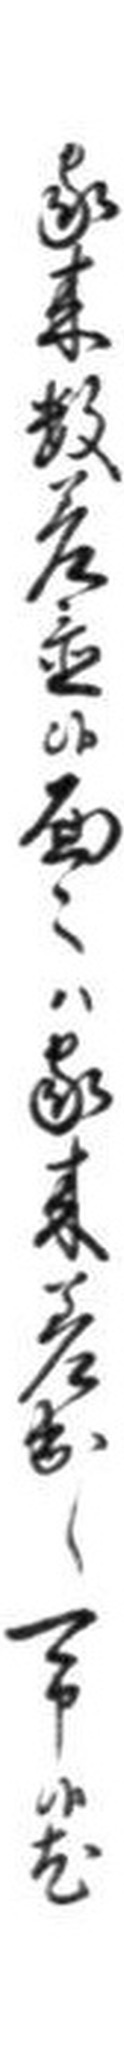家来数差置候面々ハ家来差出し可申候尤
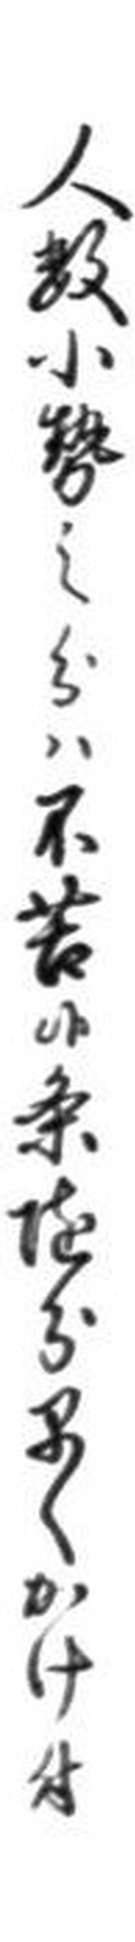人数小勢之分ハ不苦候条随分早くかけ付
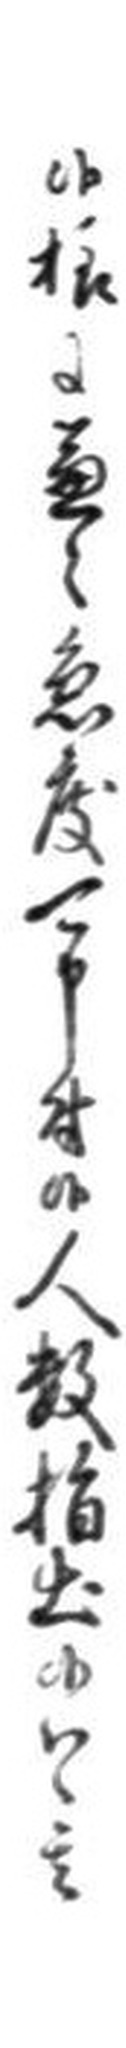候様に兼々急度可申付候人数指出候ハヽ其
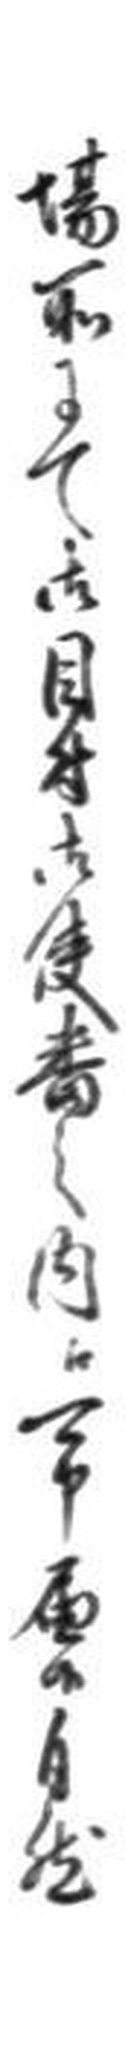場所にて御目付御使番之内江可申届候自然
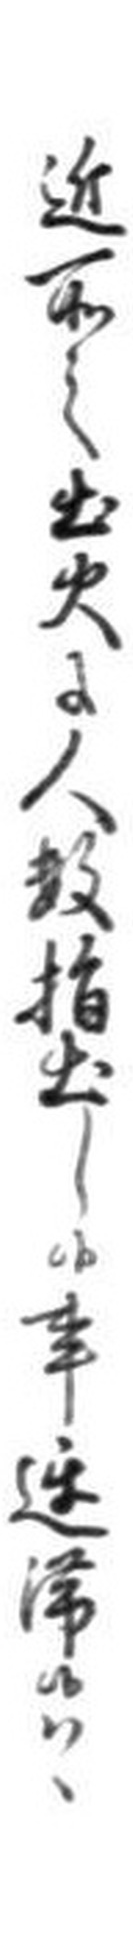近所之出火に人数指出し候事遅滞候ハヽ
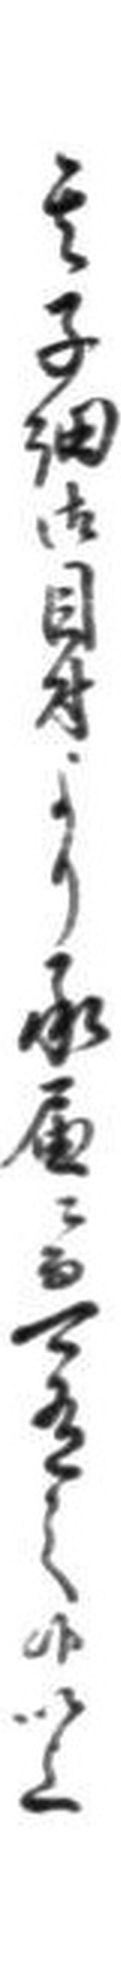其子細御目付より承届ニ而可有之候以上
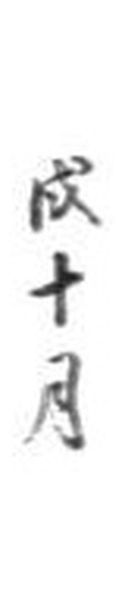戌十月
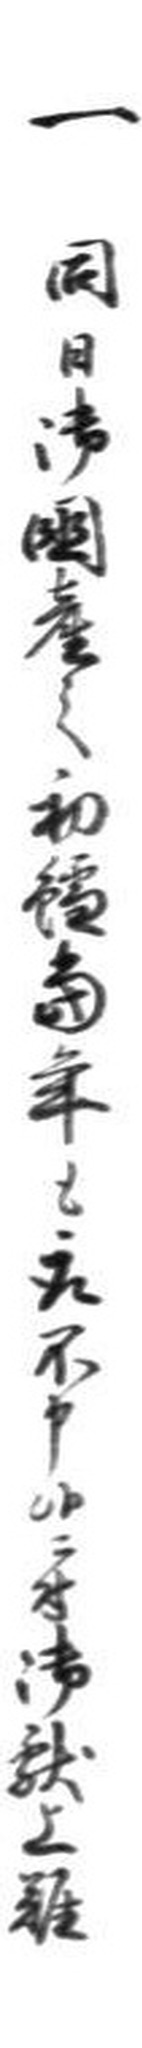一同日御国産之初鱈当年も取不申候ニ付御献上難
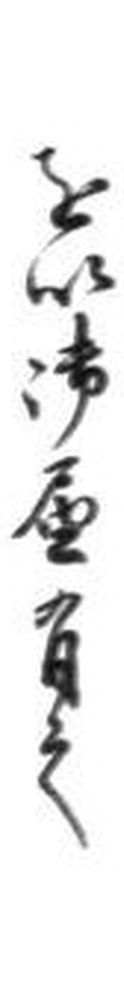を以御届有之

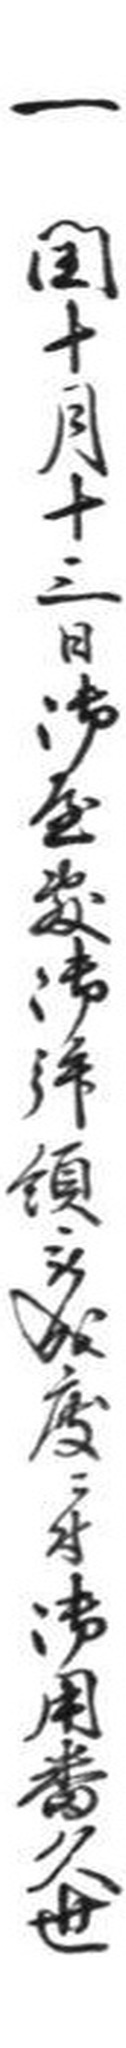一閏十月十三日御屋敷御拝領被成度ニ付御用番久世
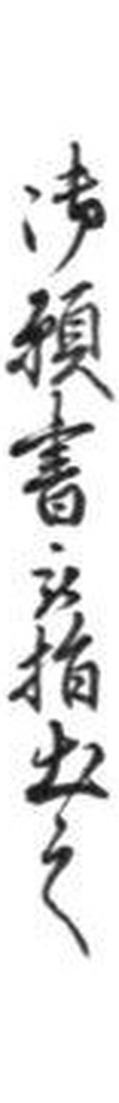御願書被指出之
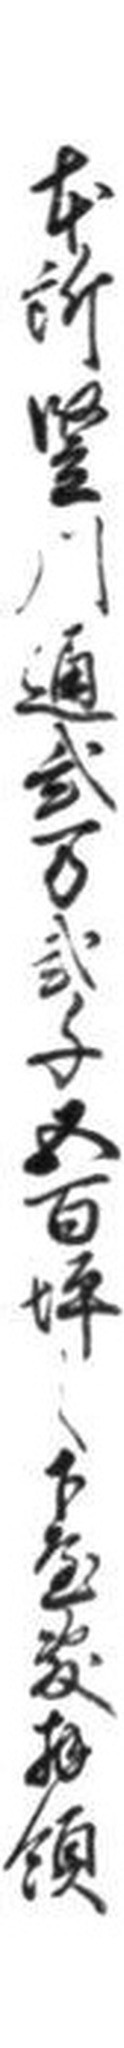本所竪川通弐万弐千五百坪之下屋敷拝領
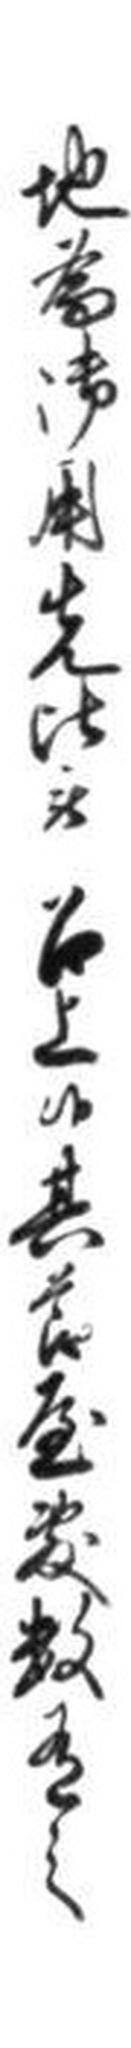地為御用先頃被召上候其節屋敷数有之
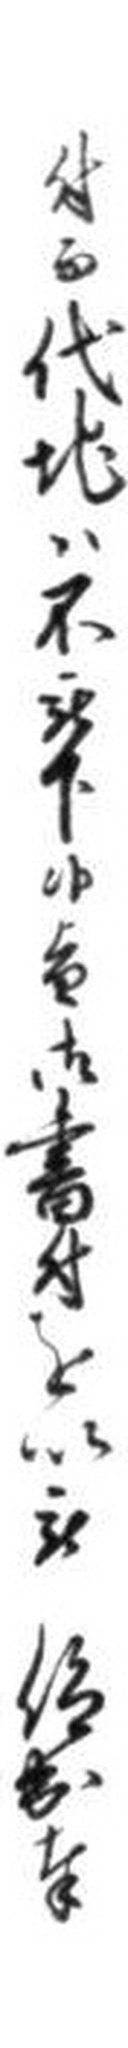付而代地ハ不被下候旨御書付を以被仰出奉
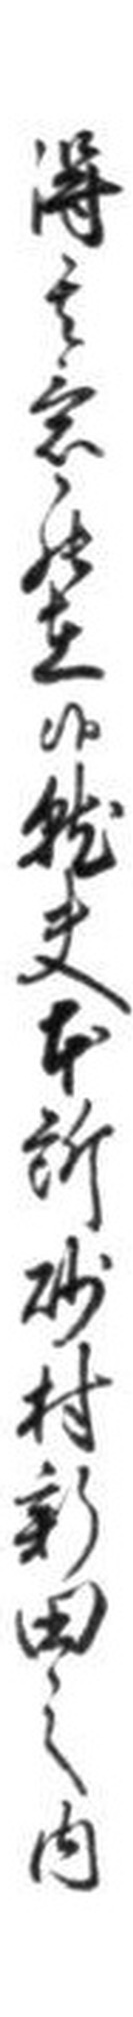得其意罷在候就夫本所砂村新田之内
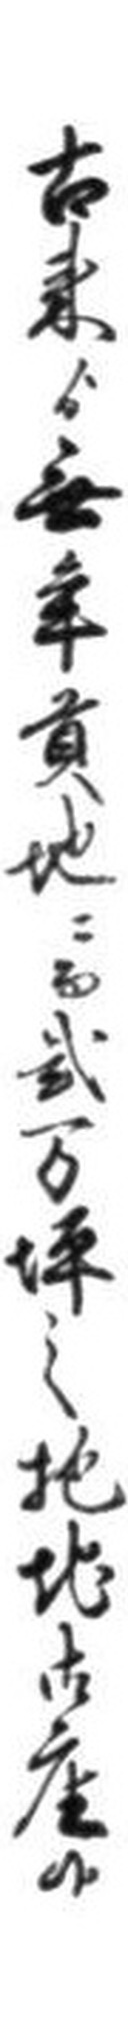古来ゟ無年貢地ニ而弐万坪之抱地御座候
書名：家譜 三十二 吉邦公 従享保二年到享保三年
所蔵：福井県文書館 Fukui Prefectural Archives
